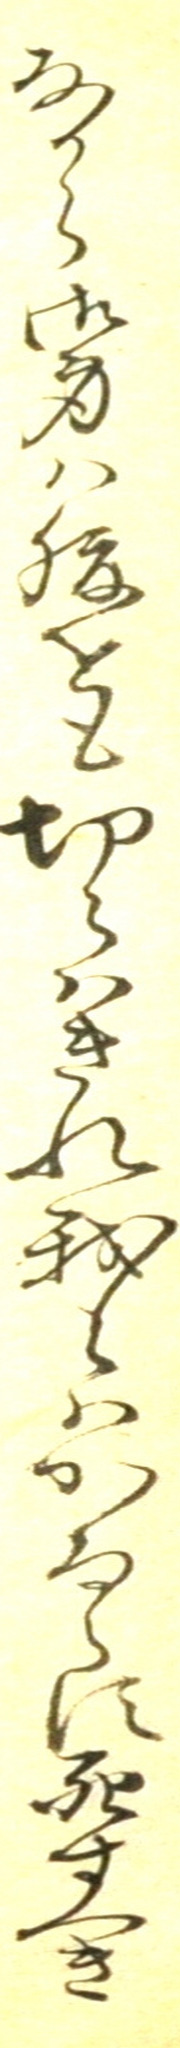なから御身は腹をも切らはきれ我らはかならす死すへき
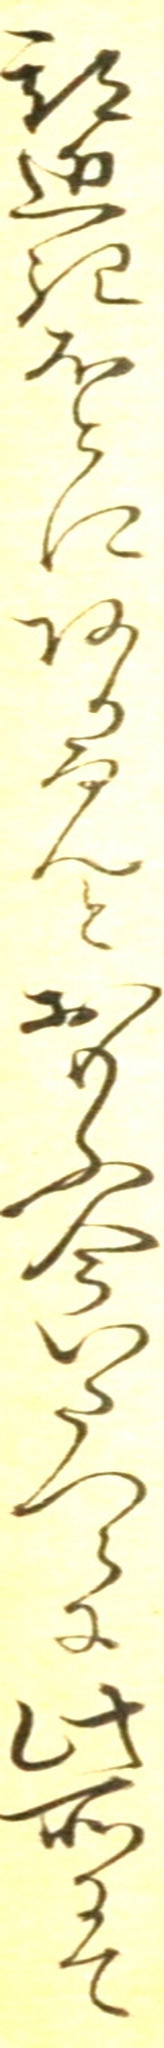期近きほとにありなんとおもふ今いたつらに此所にて
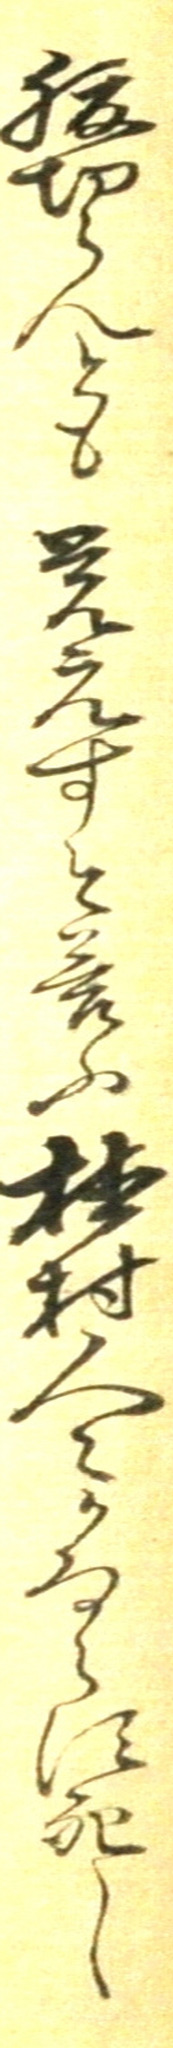腹切らんとも覚えすと答ふ植村人々かならす死し
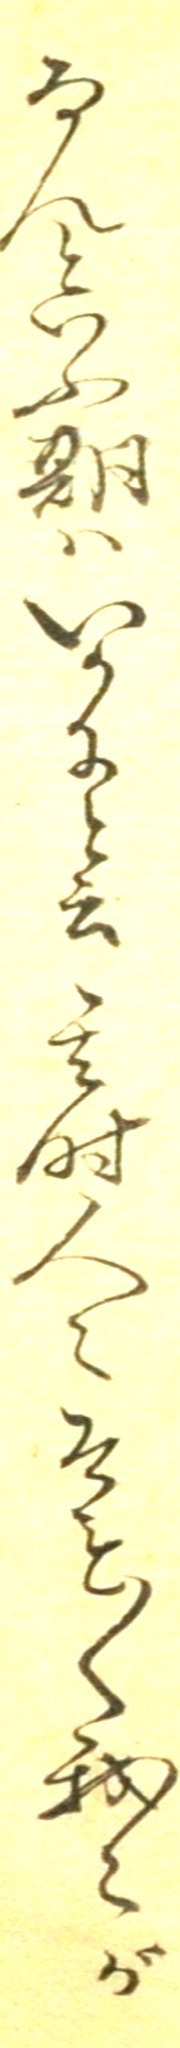なんといふ期はいかにと云其時人々そも〳〵我々が
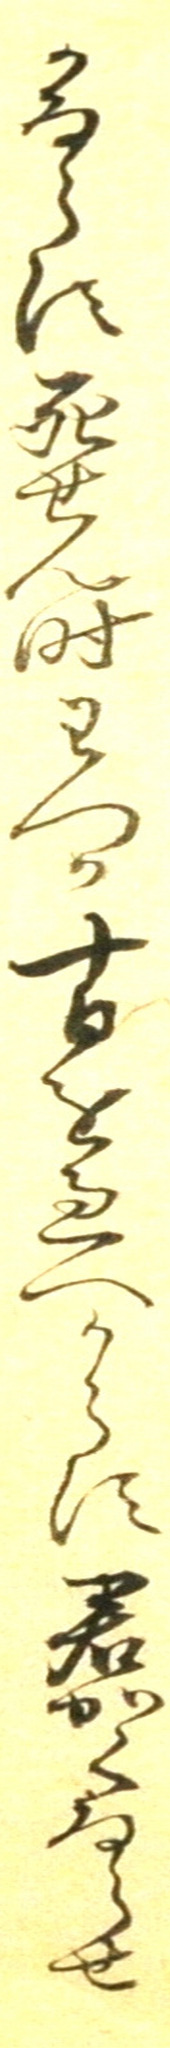かならす死せん時わつか十日を過へからす君かくならせ
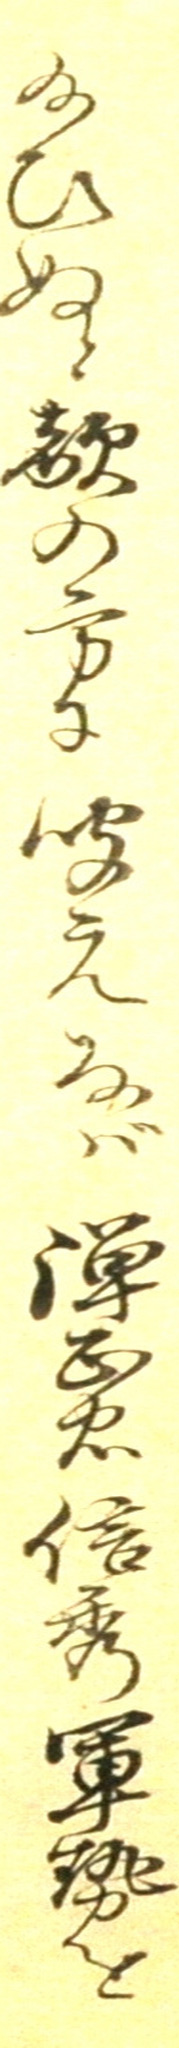給ひぬと敵の方に聞えなば弾正忠信秀軍勢を
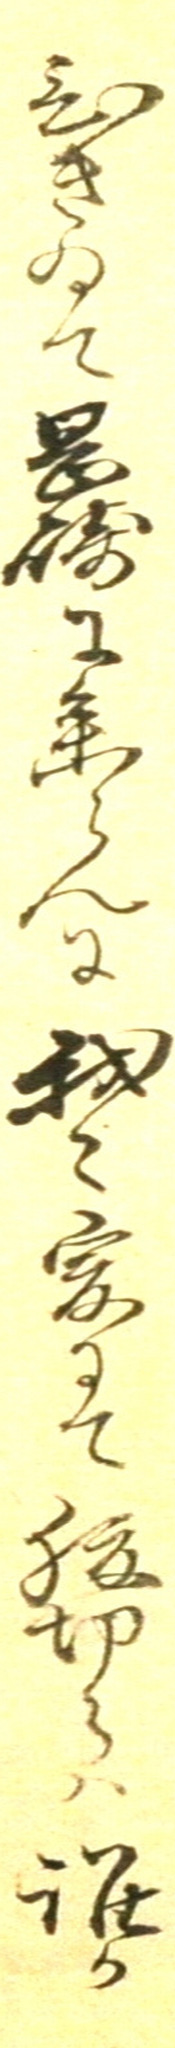ひきゐて岡崎に参らんに我々爰にて腹切らは誰か
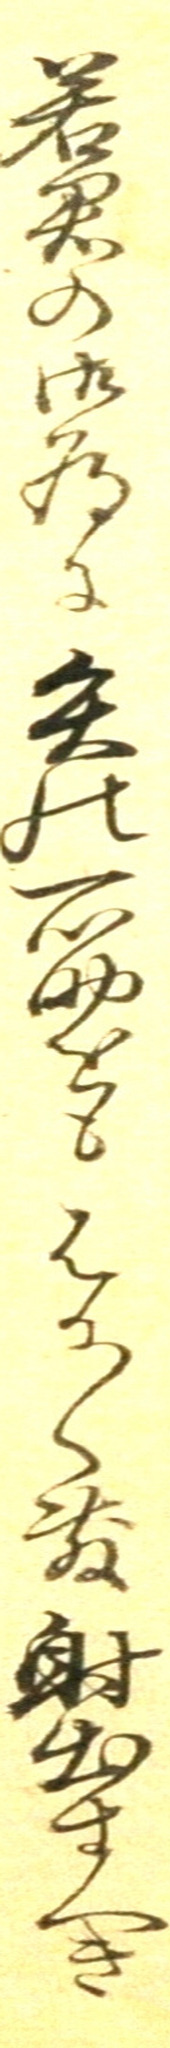若君の御為に矢の一筋をもはな〳〵敷射出すへき
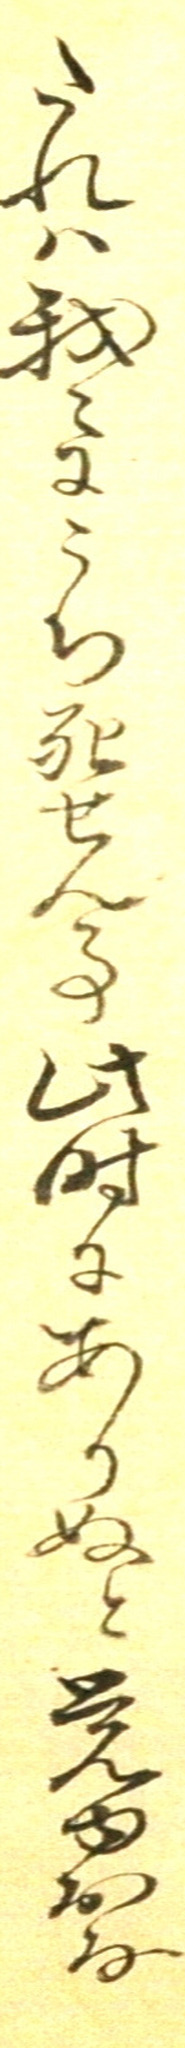たれは我々にうち死せん事此時にありぬと覚ゆおな
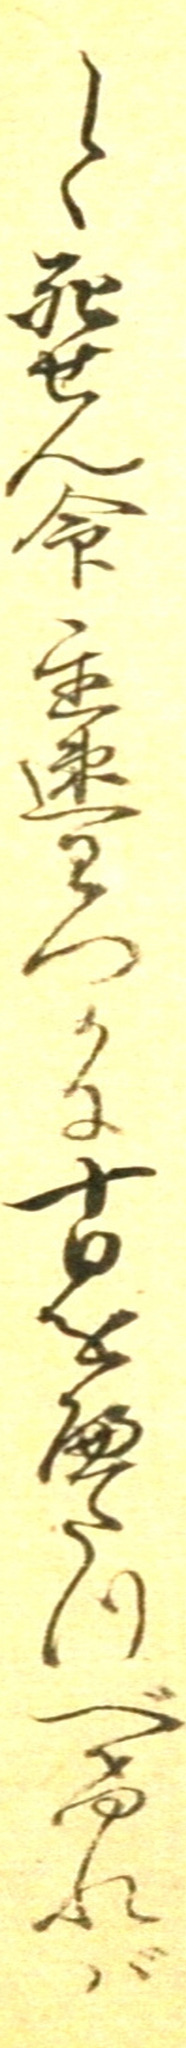しく死せん命遅速わつかにと十日をへたつべければ
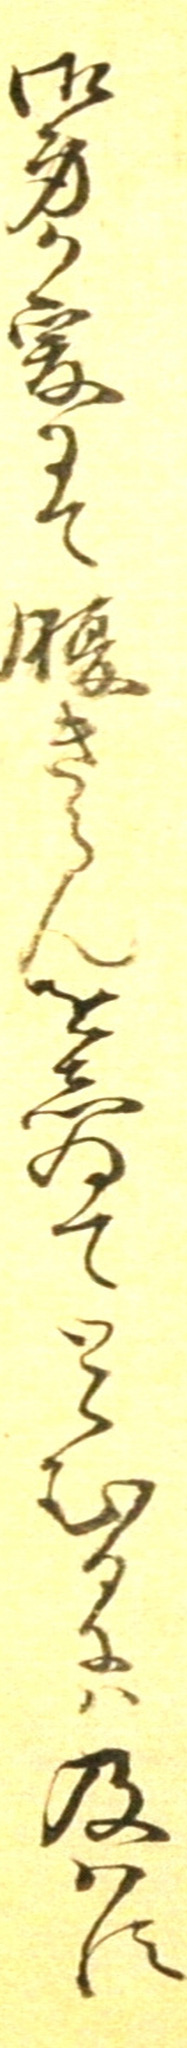御身か爰にて腹ききらんをしゐてとゝむるには及はす
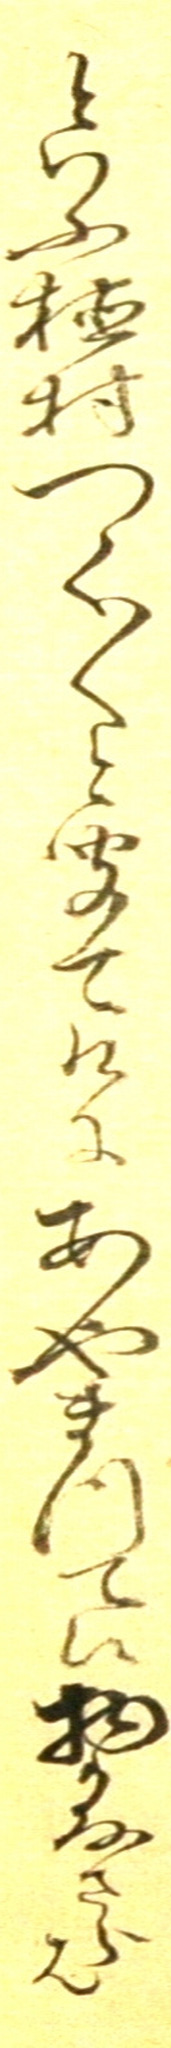といふ植村つく〳〵と聞てけにあやまつて候物かなさらは

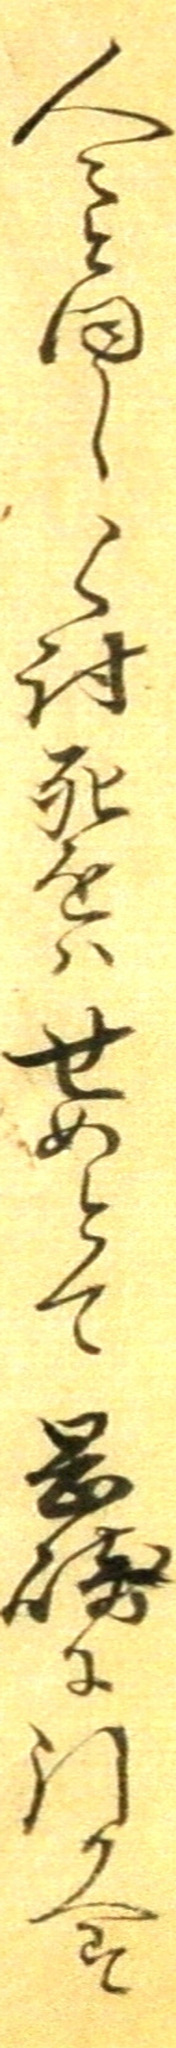人々と同しく討死をはせめとて岡崎に引かへす
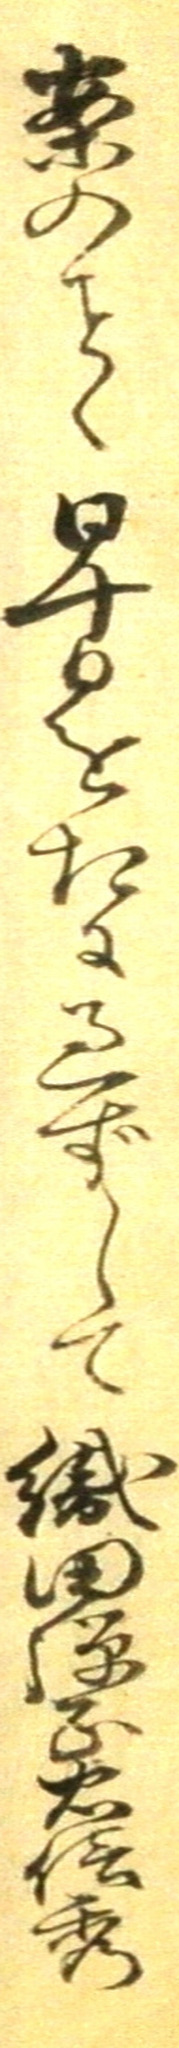案のことく日十日をたに過ずして織田弾正忠信秀
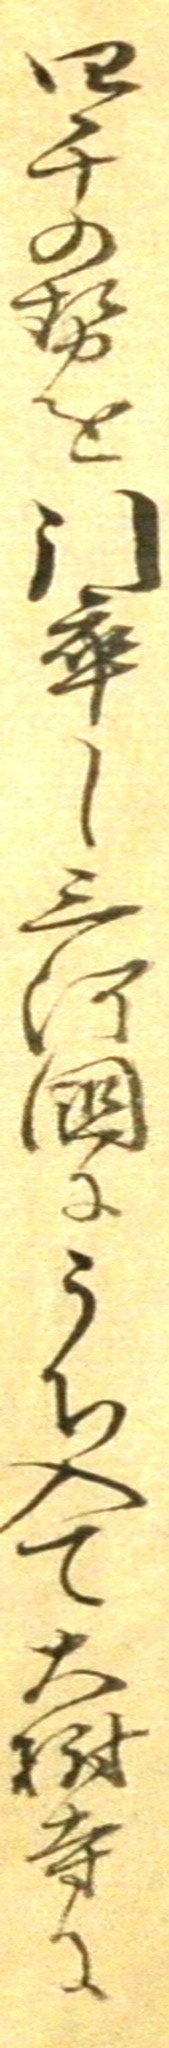四千の勢を引率し三河国にうち入て大樹寺に
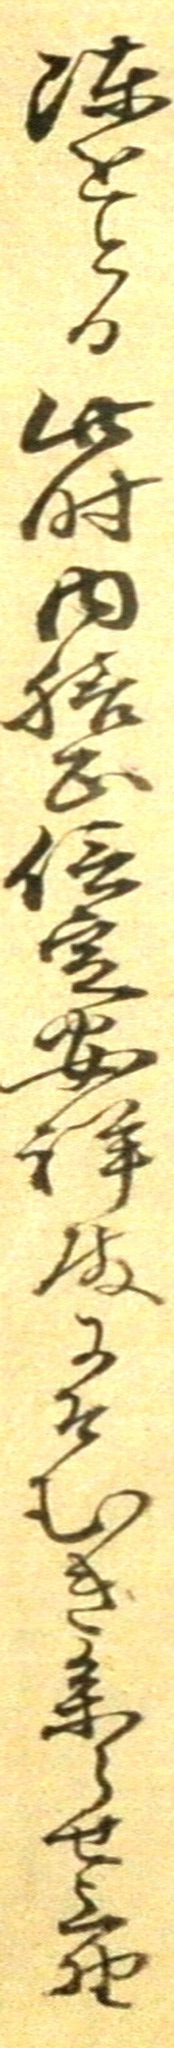陣をとる此時内膳正信定安祥殿にそむき参らせ上野
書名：藩翰譜（四・中）
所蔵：伊那市立高遠町図書館・合同会社AMANE
